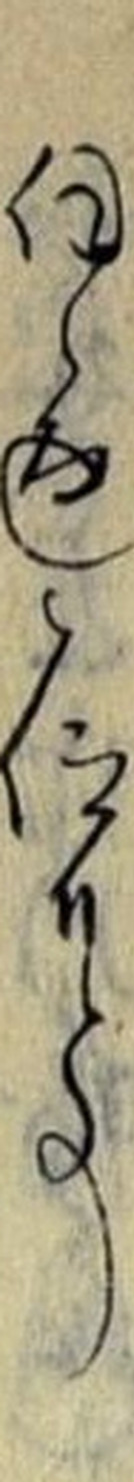伺之通被仰付候事
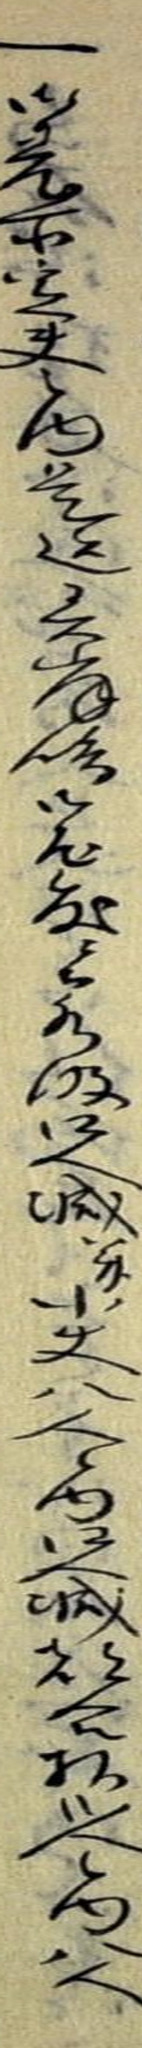一御台所定夫之内是迄霊岸嶋御屋敷ニ而水汲四人減并小使八人之内四人減都合拾弐人之内八人
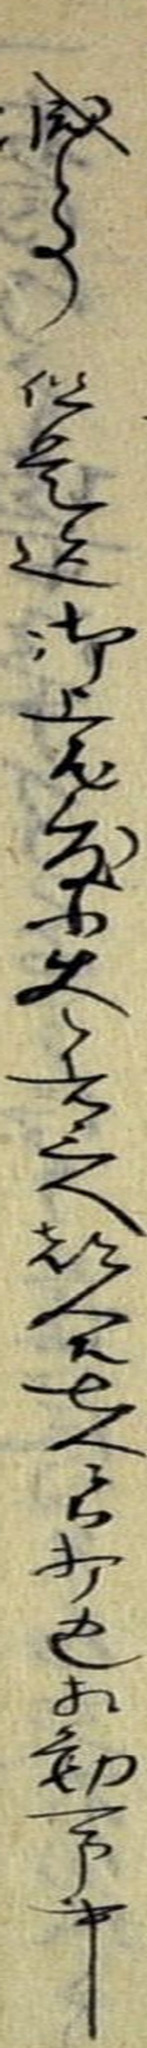減候事但是迄御上屋敷小使之者三人都合七人ニ而打込相勤可申事
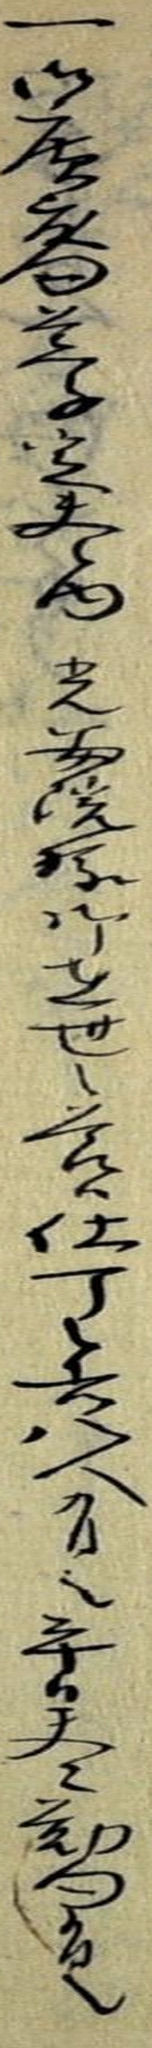一御広敷向荒子定夫之内光安院様御在世之節ハ仕丁之者八人有之平日夫々
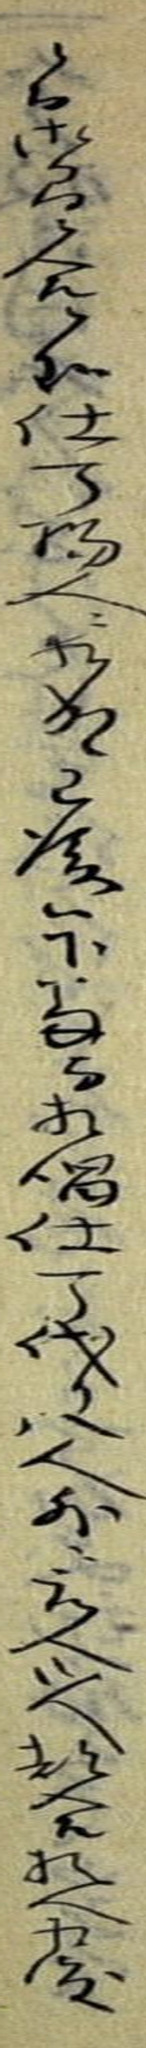候而御間ニ合候処仕丁揚人ニ相成候已後ハ下番与相唱仕丁代り八人外ニ取人弐人都合拾人相渡
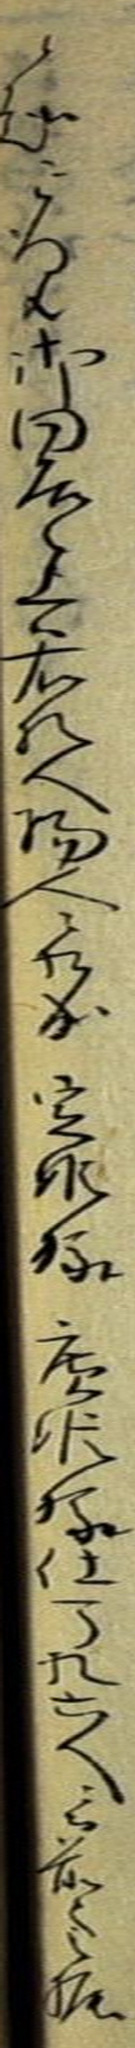候趣ニ候得共御同居之上ハ右拾人揚人ニ相成定姫様広姫様仕丁拾六人ニ而前々之振
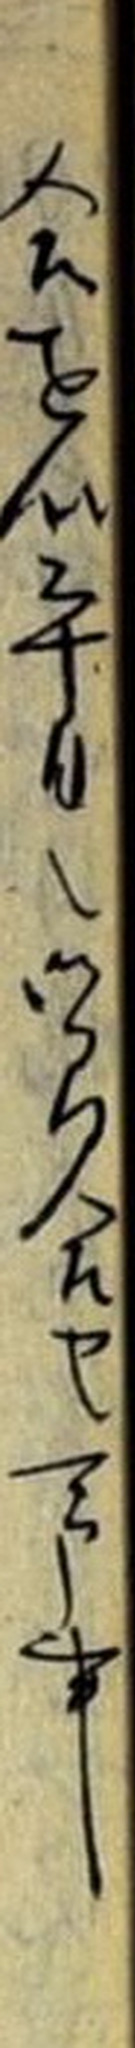合を以平日之御間合セ可申事
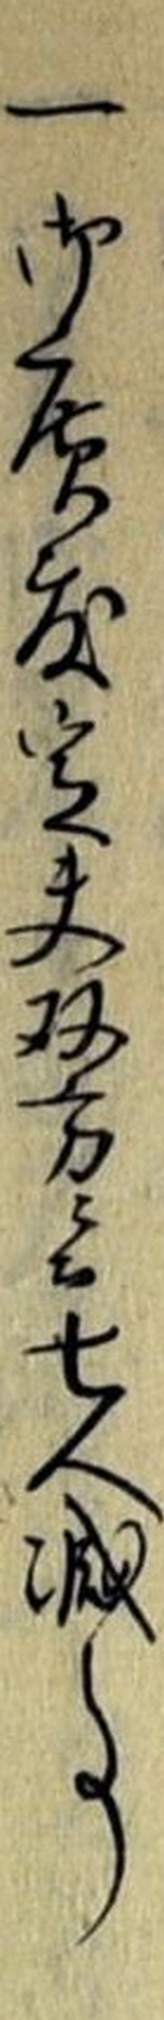一御広敷定夫双方ニ而七人減候事
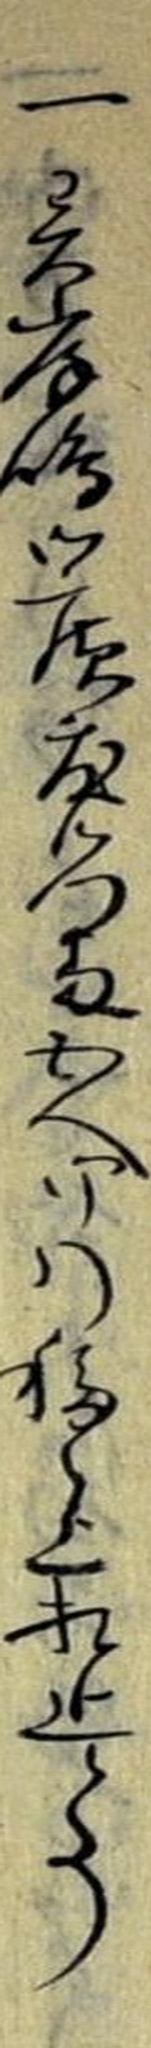一霊岸嶋御広敷御門番五人御引移候上相止候事
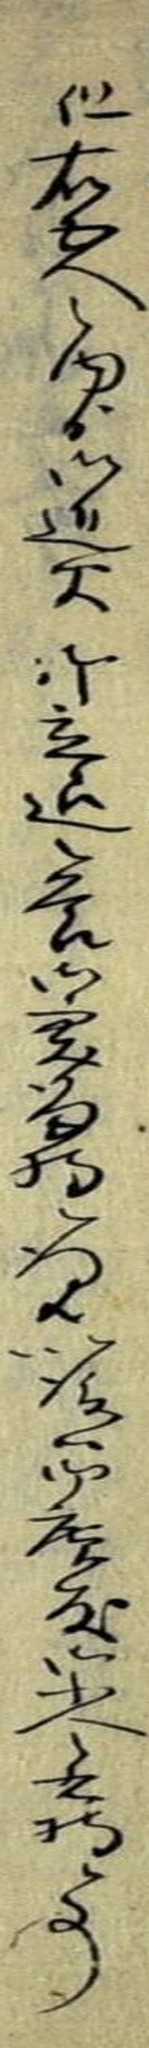但右五人之内ゟ御近火御立退之節御持候得共以後ハ御広敷御小人之者持候事
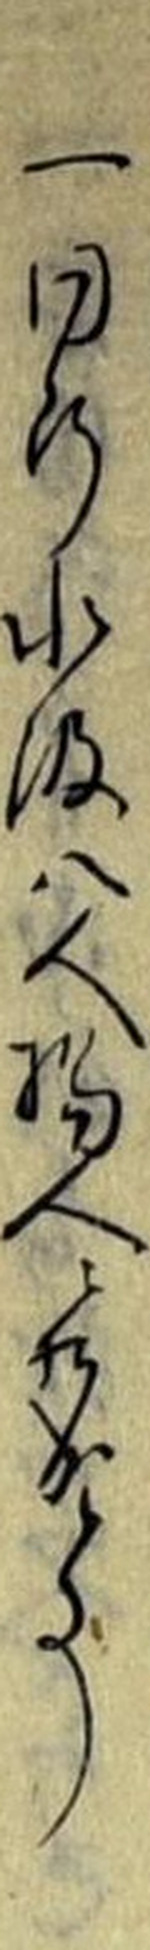一同断水汲八人揚人ニ相成候事
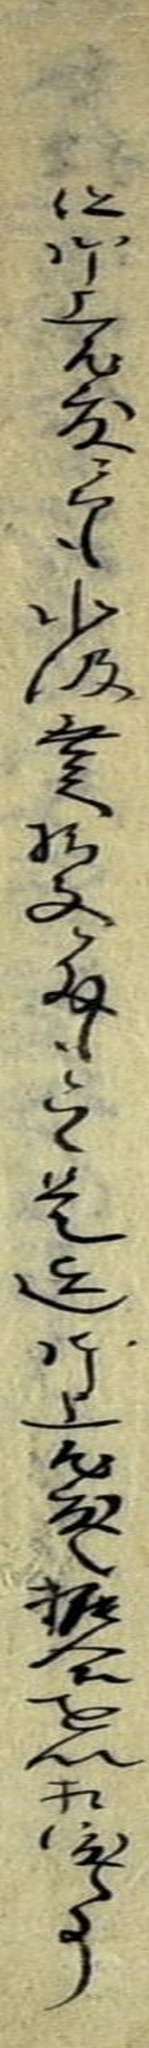但御上屋敷ニ而も水汲無之指支候義も候ハヽ是迄御上屋敷之振合を以相渡候事
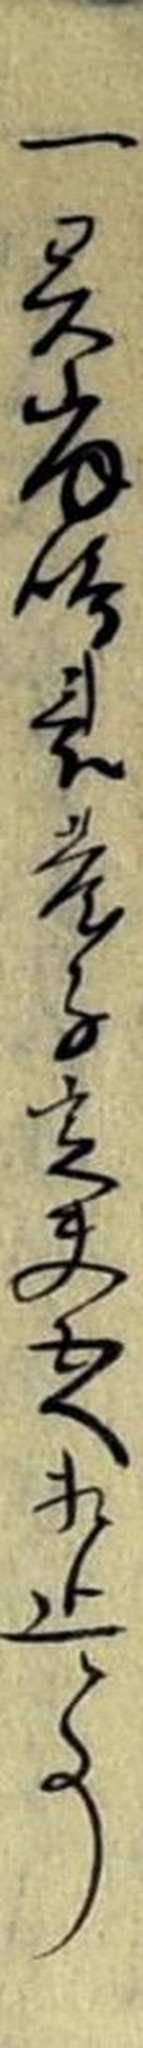一霊岸嶋表台子定夫五人相止候事
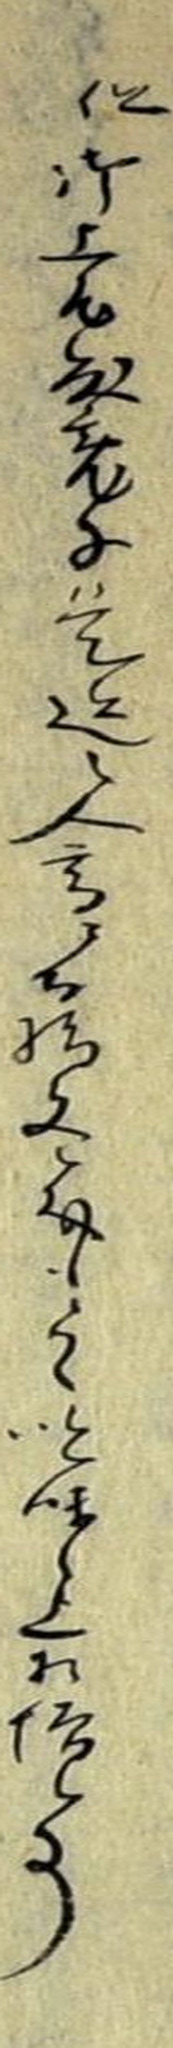但御上屋敷台子是迄之人高ニ而指支候義も候ハヽ吟味之上相増候事
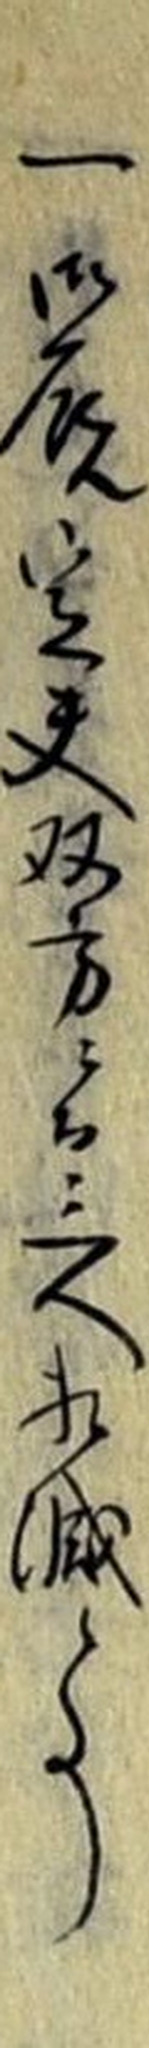一御厩定夫双方ニ而三人相減候事
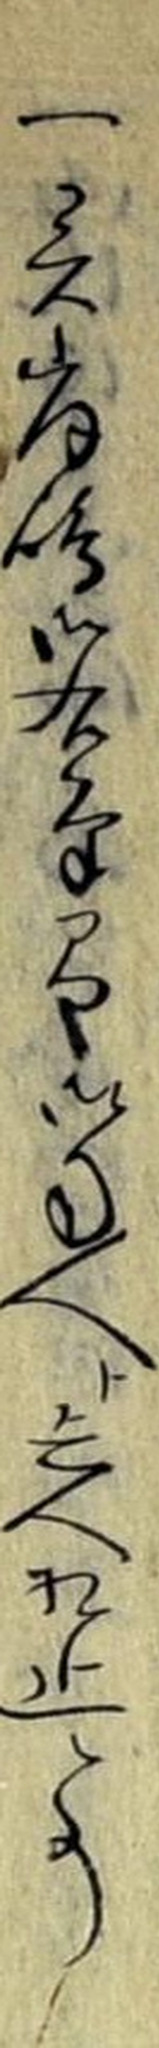一霊岸嶋御右筆部屋御用人壱人相止候事
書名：命令之部 三
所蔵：福井県文書館 Fukui Prefectural Archives
